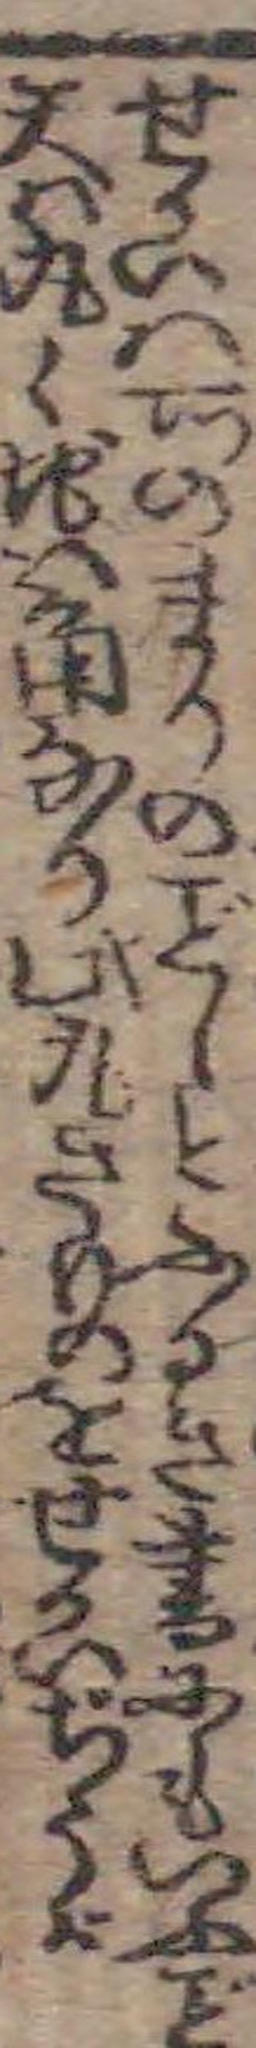天は丸く地は角なり此丸きものをせかいぢうが

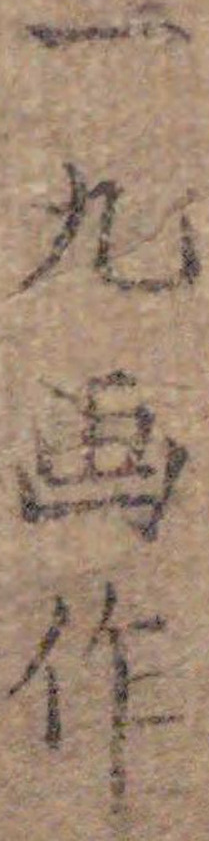一九画作
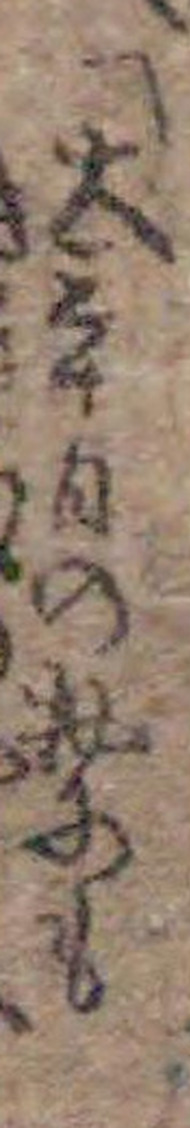〽大三十日のおにも
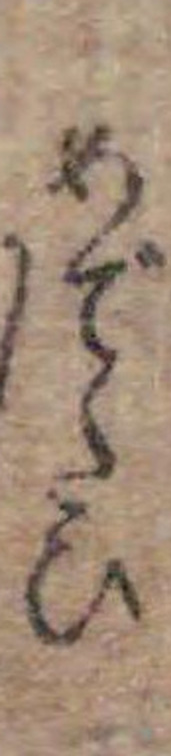めでたひ
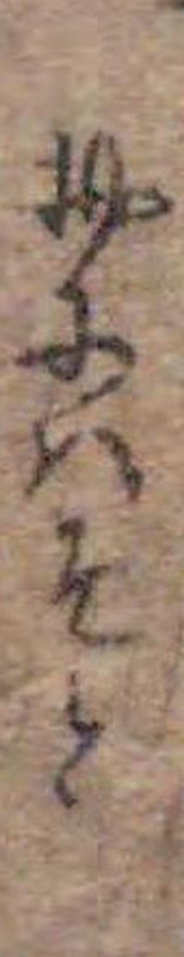おにはそと
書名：奇妙頂礼胎錫杖 : 3巻
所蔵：国立国会図書館 National Diet Library, JAPAN
